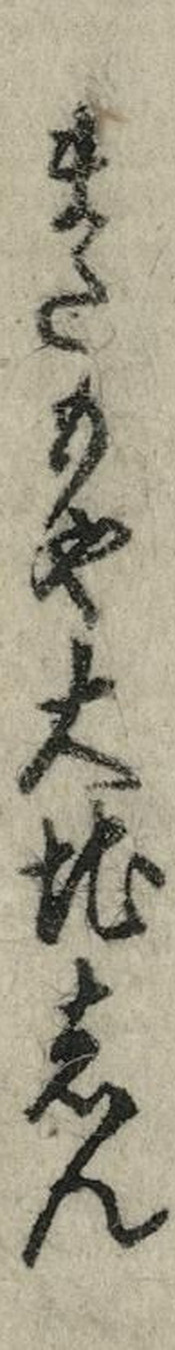またもや大地しん
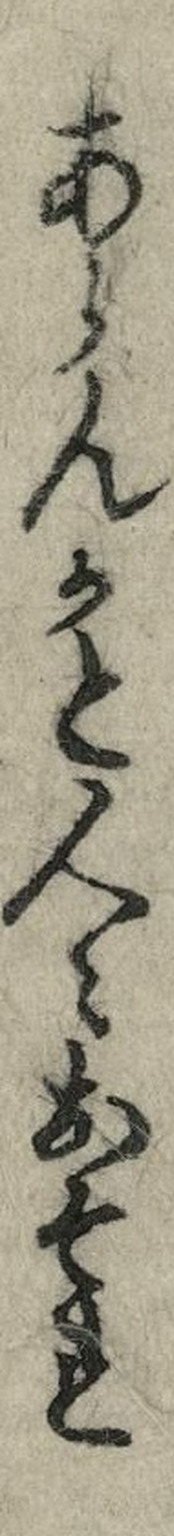あらんかと人々おそれ
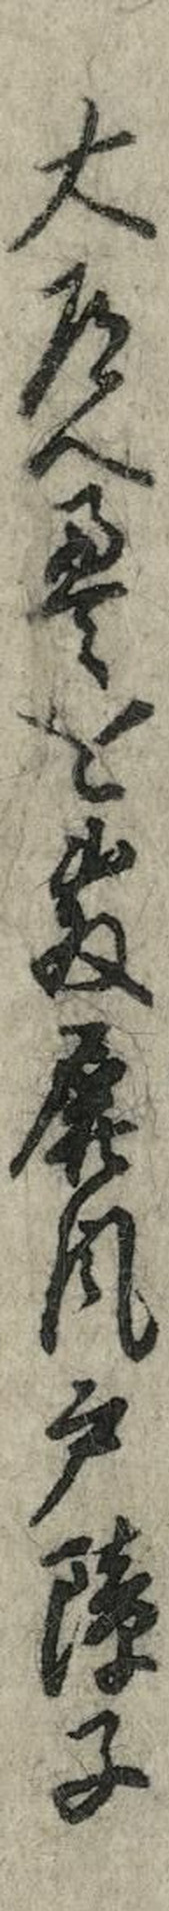大道へ畳を敷屏風戸障子
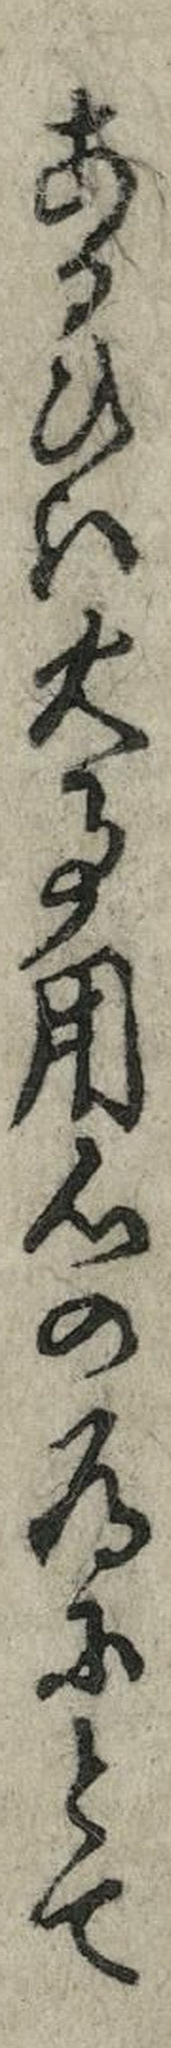あるひは大事用心の為にとて
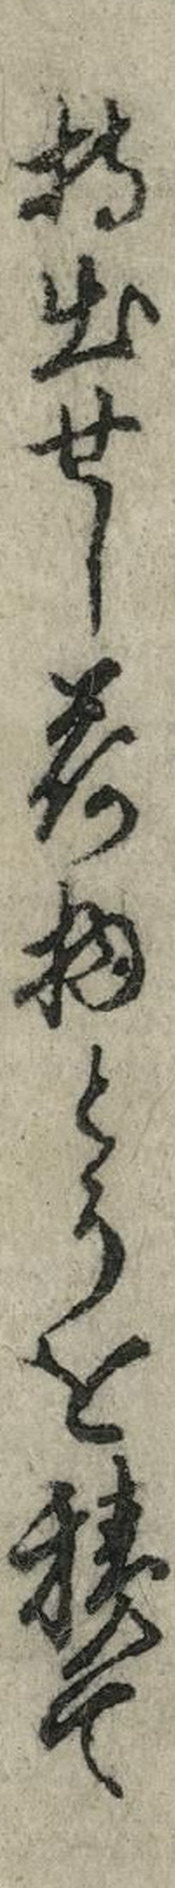持出せし荷物とうを積て
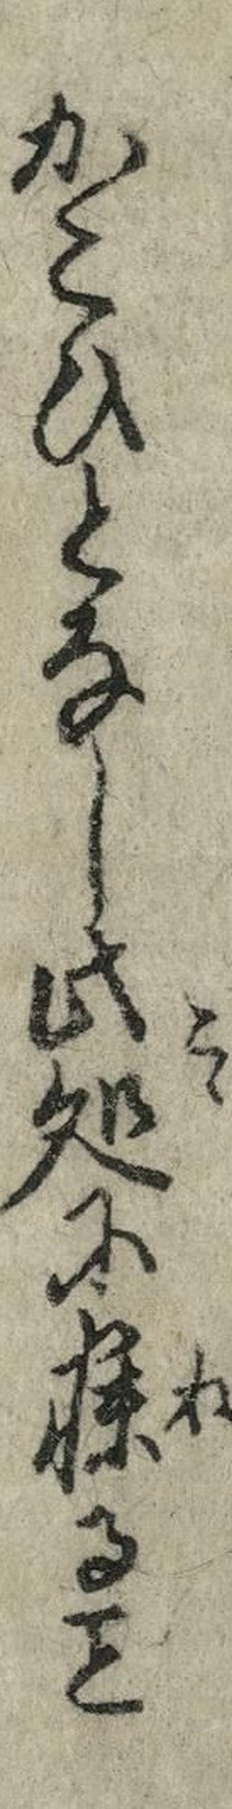かこひとなし此処に寝ること
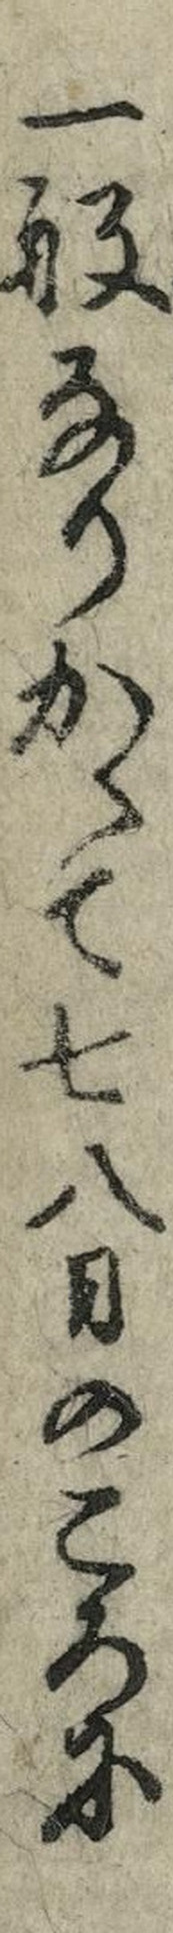一般なりかくて七八日のころに
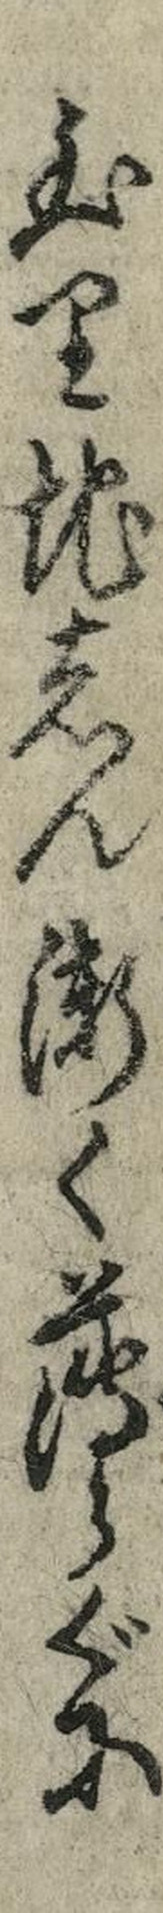至り地しん漸く薄らぐに
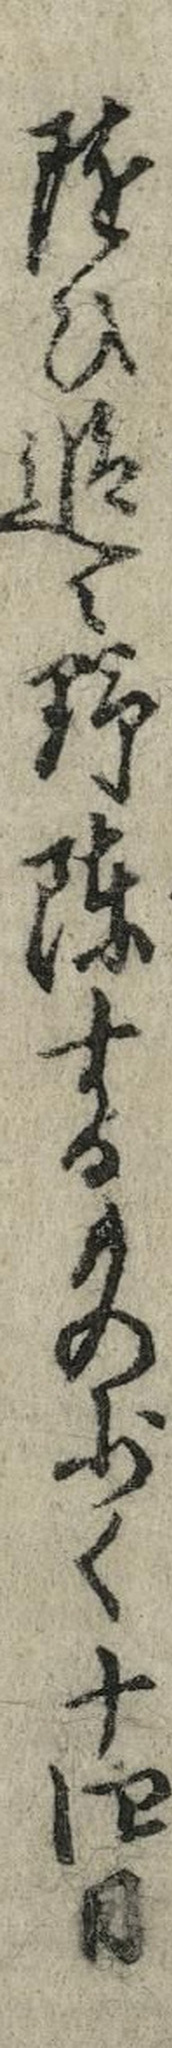随ひ追々野陣するもの少く十四日
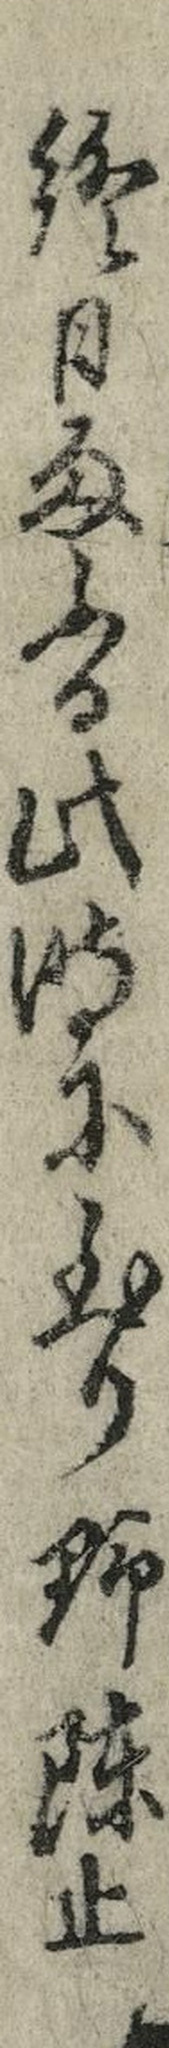終日雨ふる此時に至り野陣止
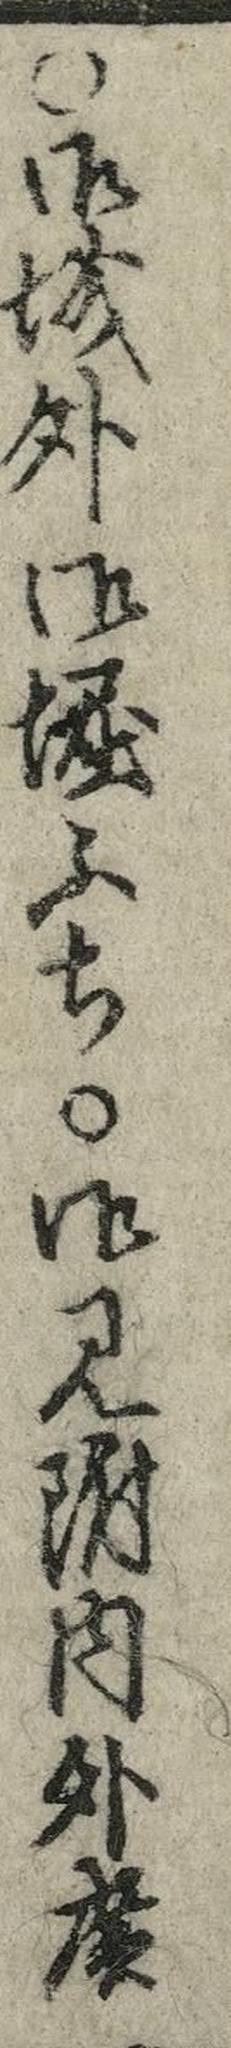○御城外御堀ふち○御見附内外広
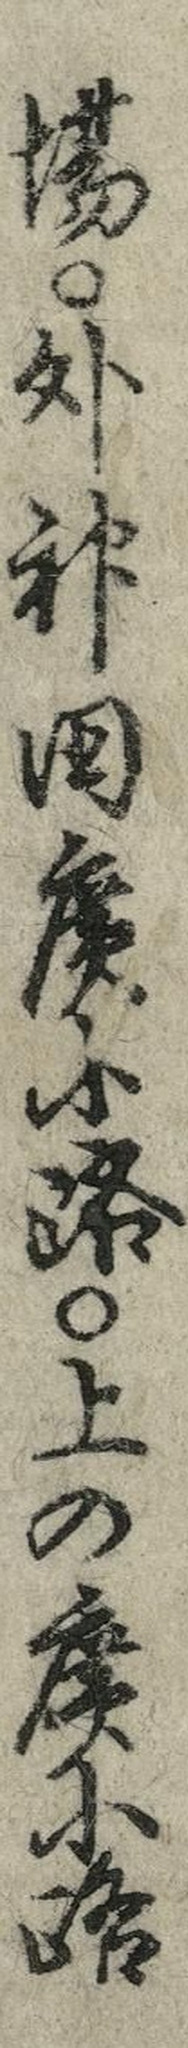場○外神田広小路○上の広小路
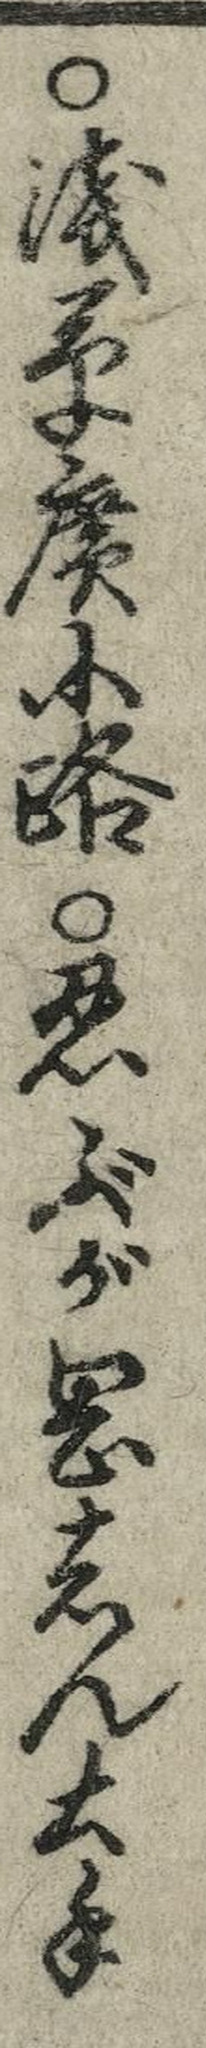○浅草広小路○忍ぶが岡しん土手
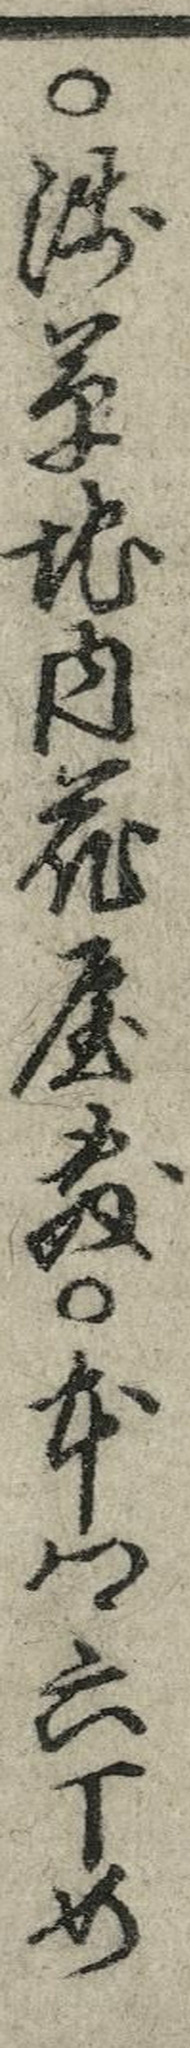○浅草地内花屋敷○本郷六丁め
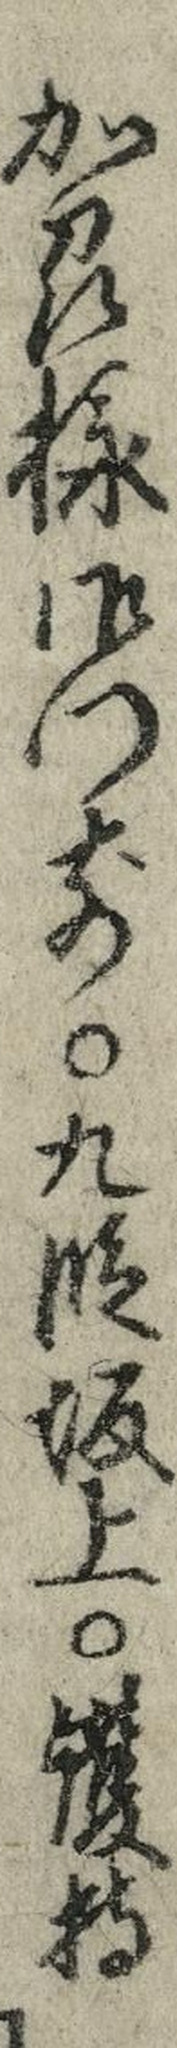加州様御門前○九段坂上○護持
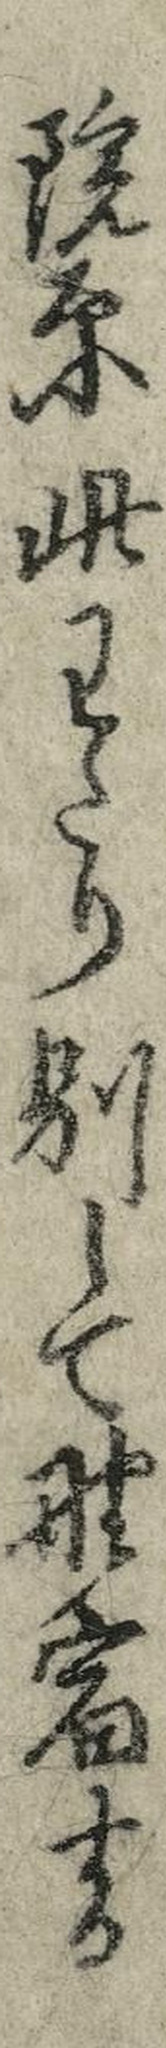院原此わたり別して野宿する
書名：江戸　大地震末代噺の種　全
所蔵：東京大学地震研究所図書室 Earthquake Research Institute Library, The University of Tokyo, JAPAN
